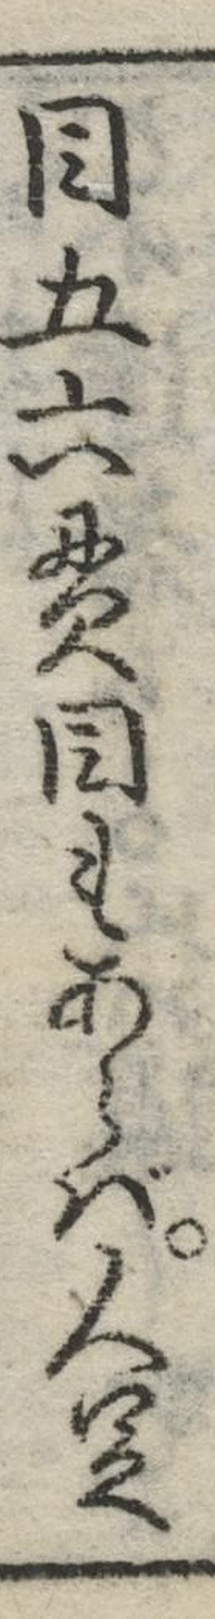目五六貫目もあらば。人足
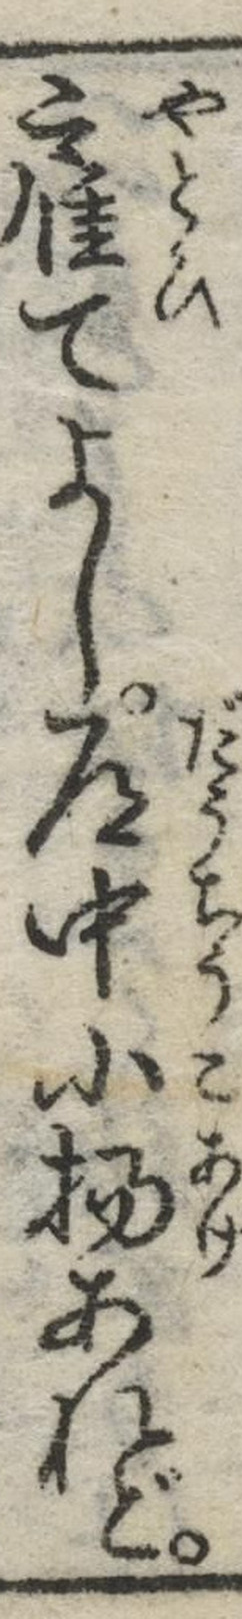雇てよし。道中小揚あれど。
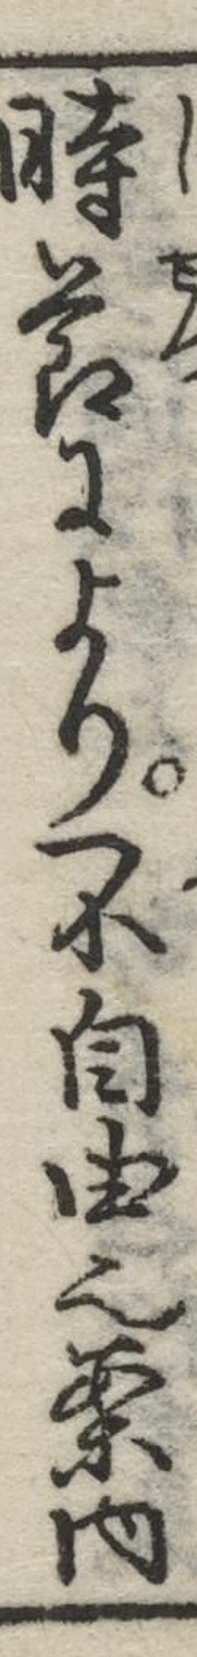時節により。不自由也。案内
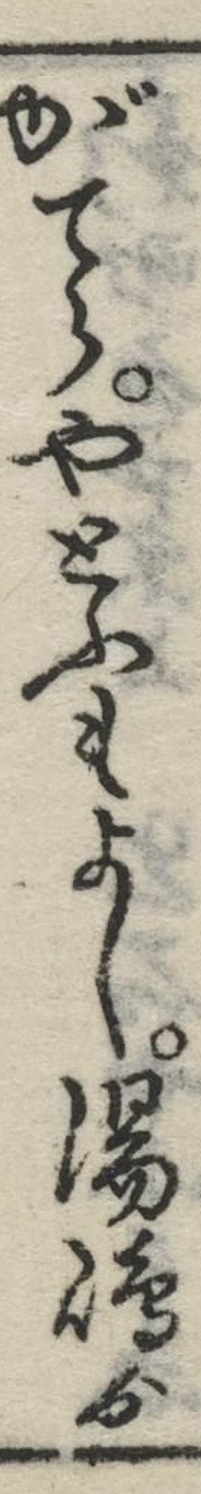がてら。やとふもよし。湯嶋ゟ
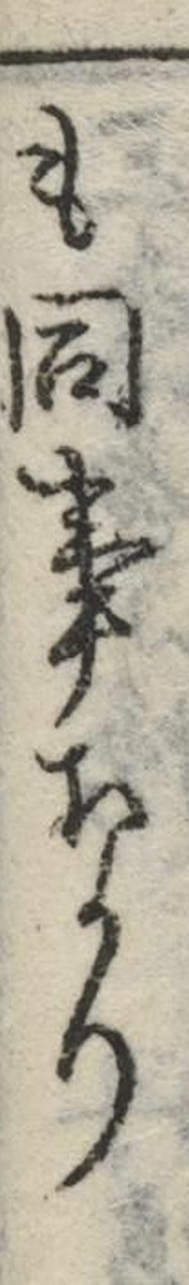も同事なり
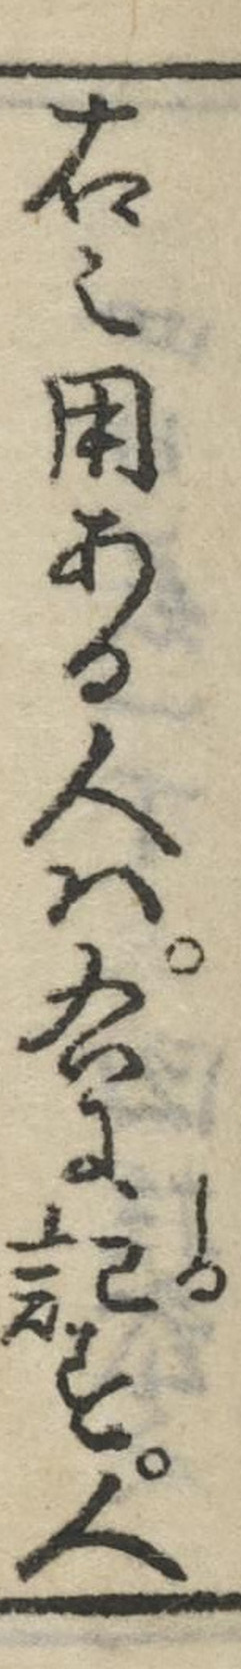右之用ある人は。右に記す。人
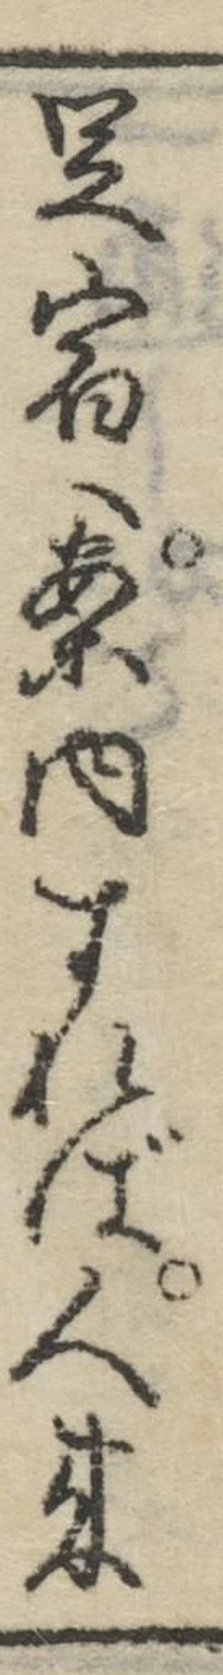足宿へ。案内すれば。人来
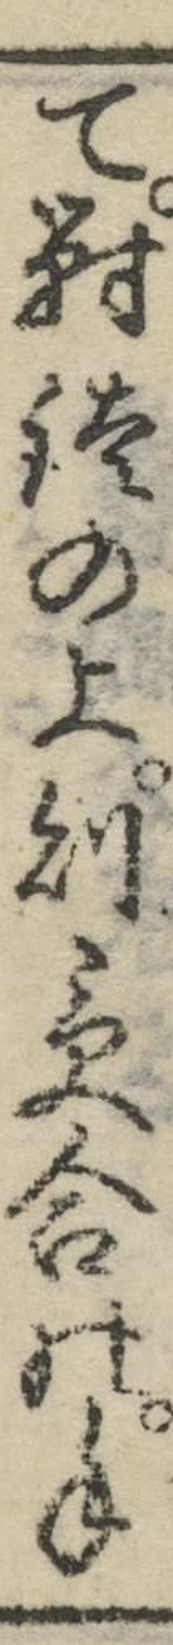て。対談の上。即受合の。手
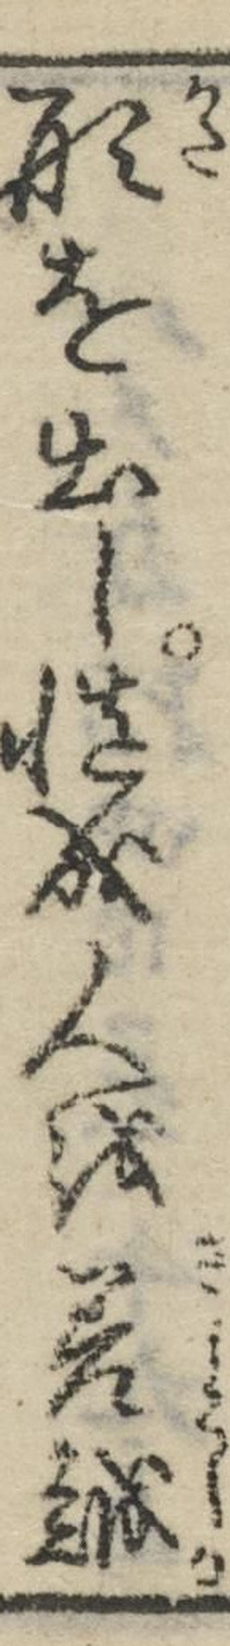形を出し。慥成人を差越。
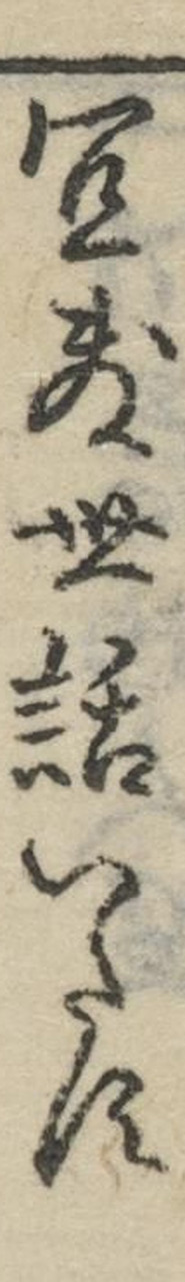宜敷世話いたす
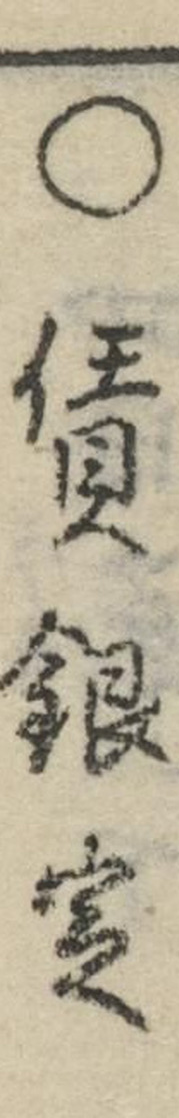〇賃銀定
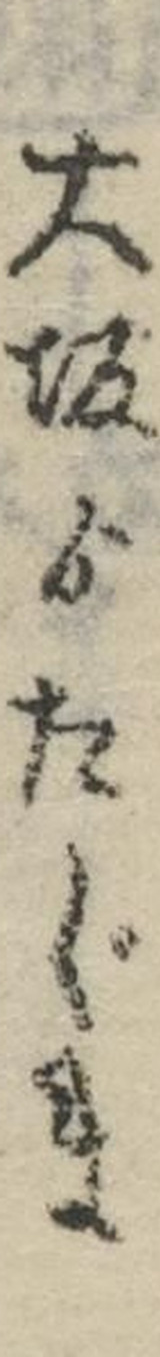大坂ゟたじま
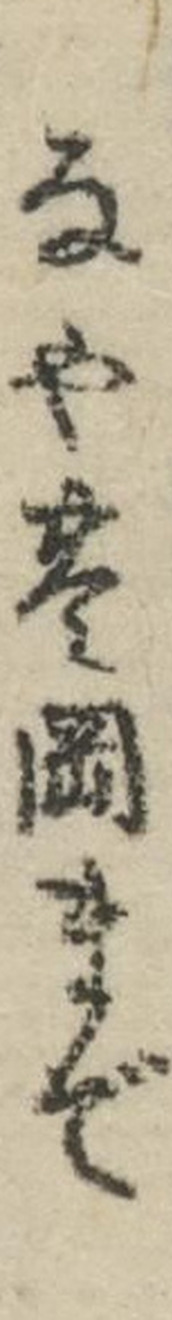なや豊岡まで
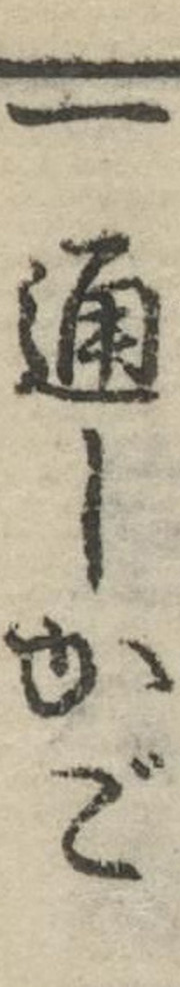一通しかご
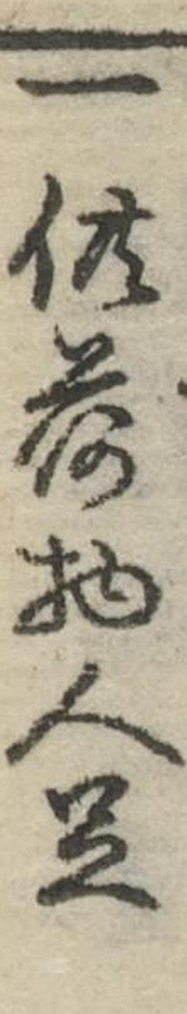一供荷物人足
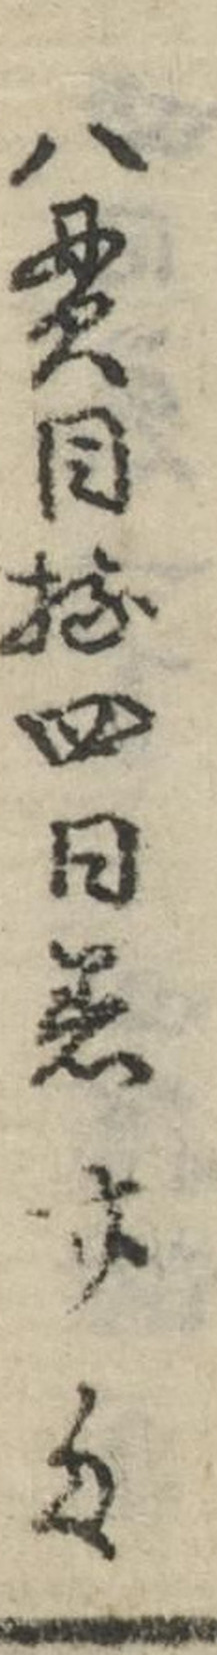八貫目持四日着廿匁
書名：但州城崎浴湯辧
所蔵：東京大学地震研究所図書室 Earthquake Research Institute Library, The University of Tokyo, JAPAN
